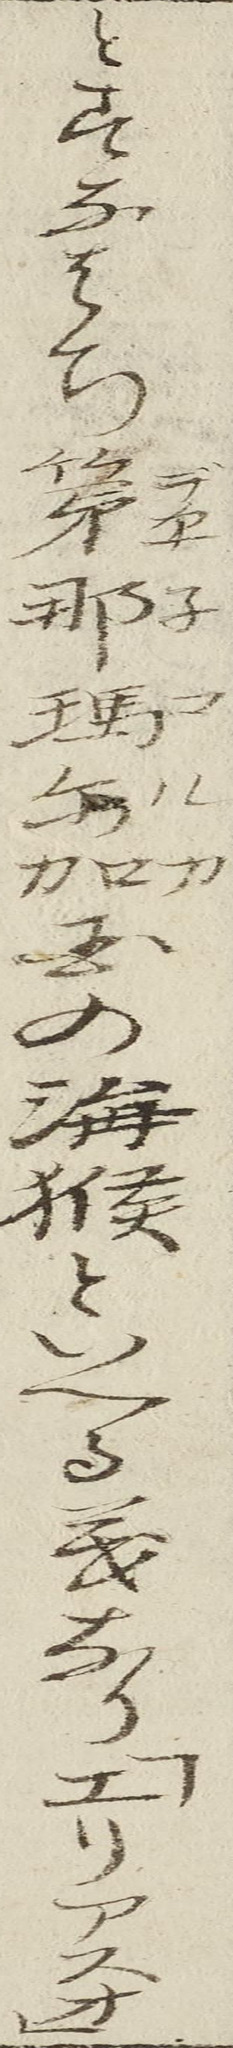とすなはち第那瑪尓加国海猴といへる義なり「エリアスオ」
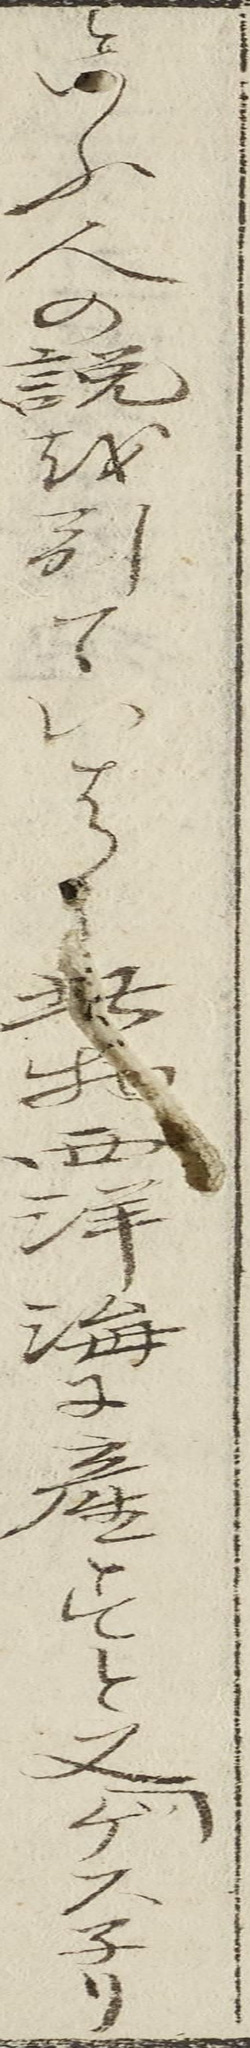といふ人の説を引ていはく此物西洋海に産すと又「ゲス子リ
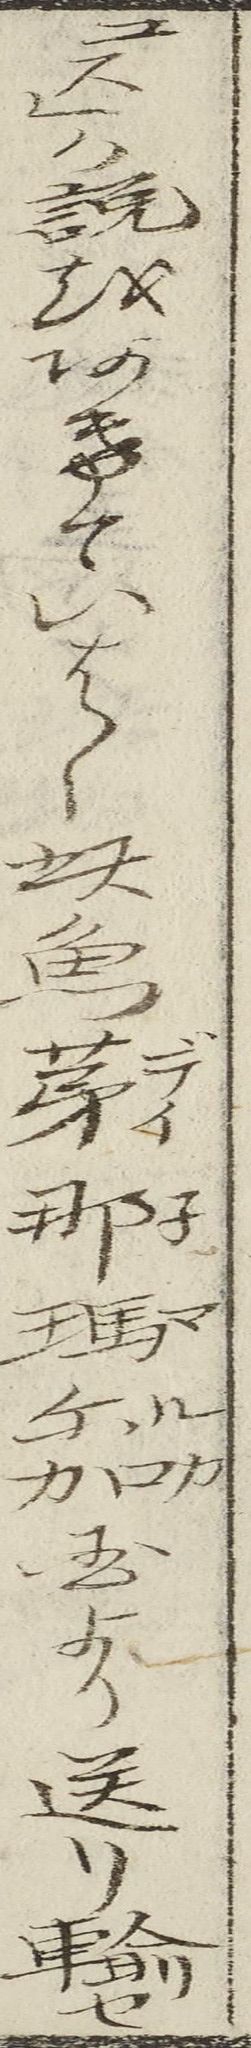ュす」の説をあけていはく此魚第那瑪尓加国より送り輸せ
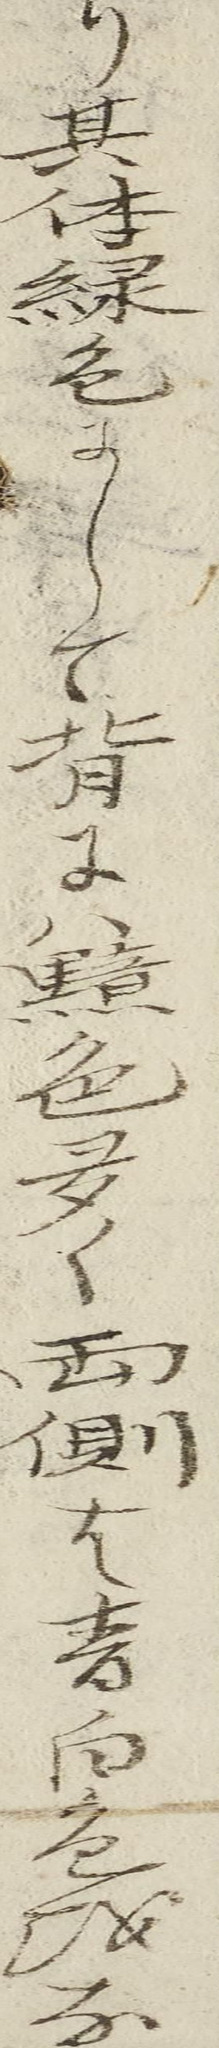り其体緑色にして脊にハ黯色多く両側は青白色をな
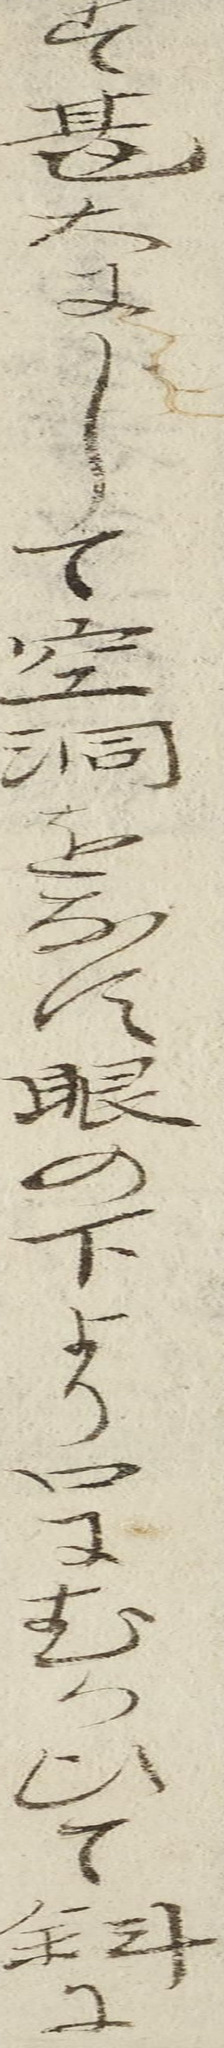す甚大にして空洞をなす眼の下より口にむかひて斜に
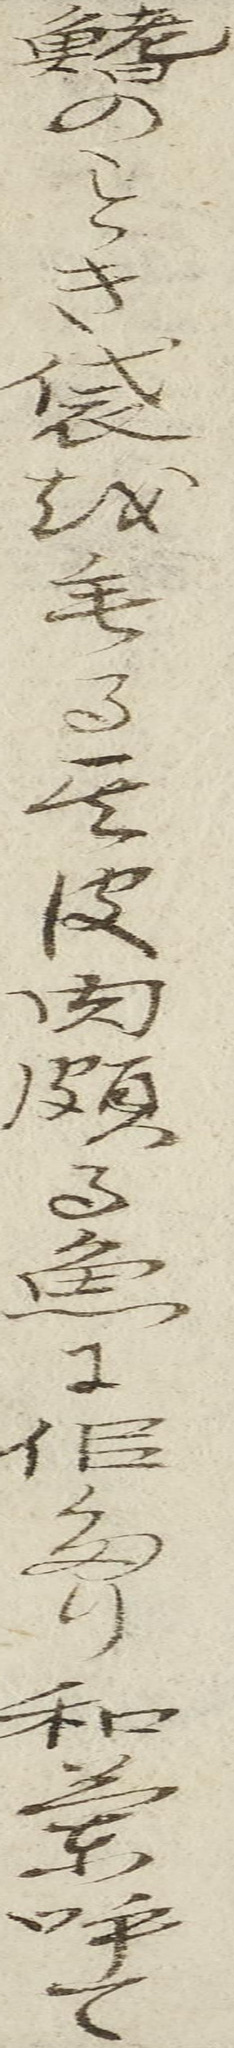鰭のことき袋を毛る其皮肉頗る魚佀り和蘭呼て

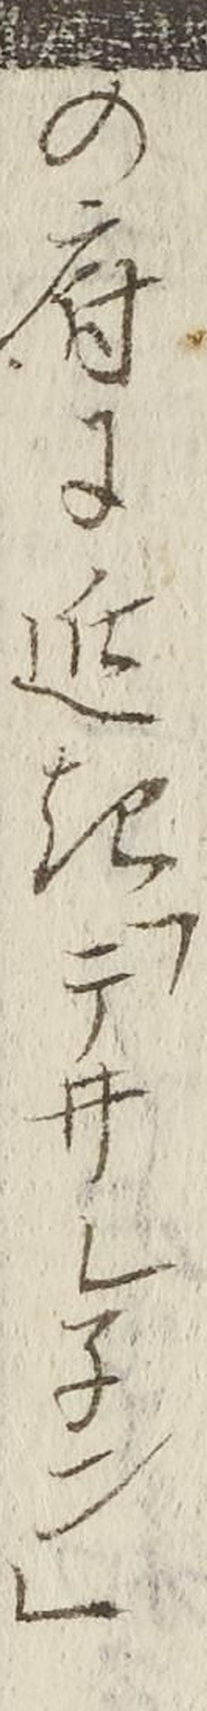の府に近き「テ井レ子ン」
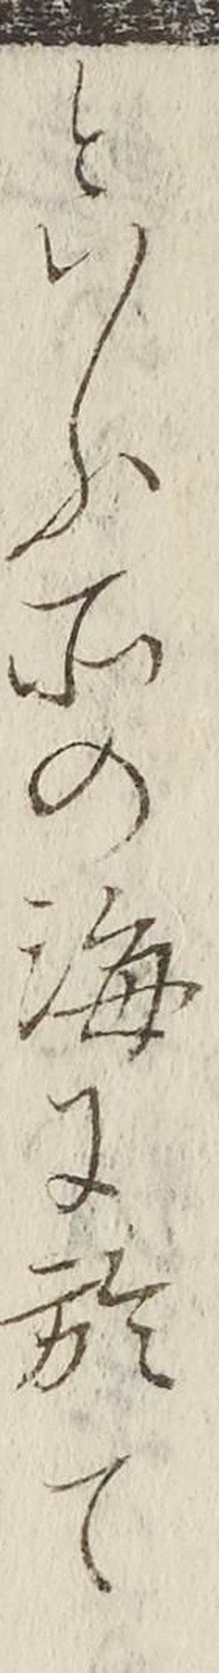といふ所の海に於て
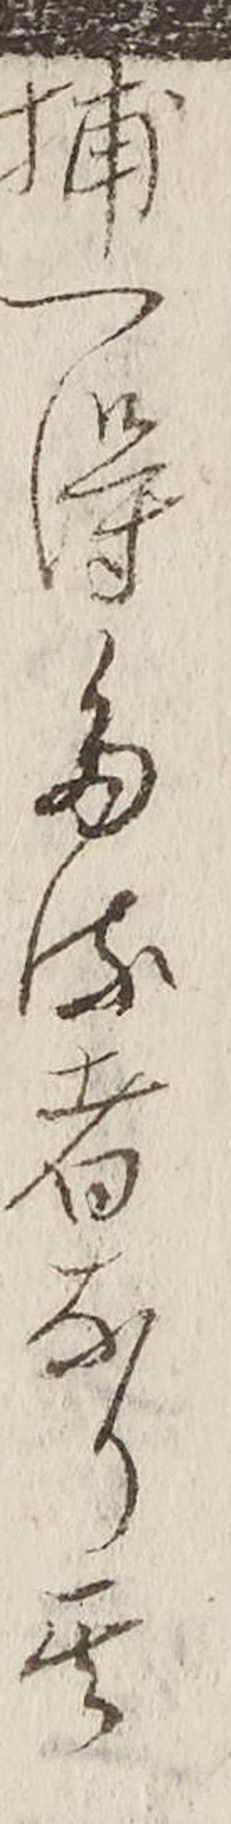捕へ得たる者なり其
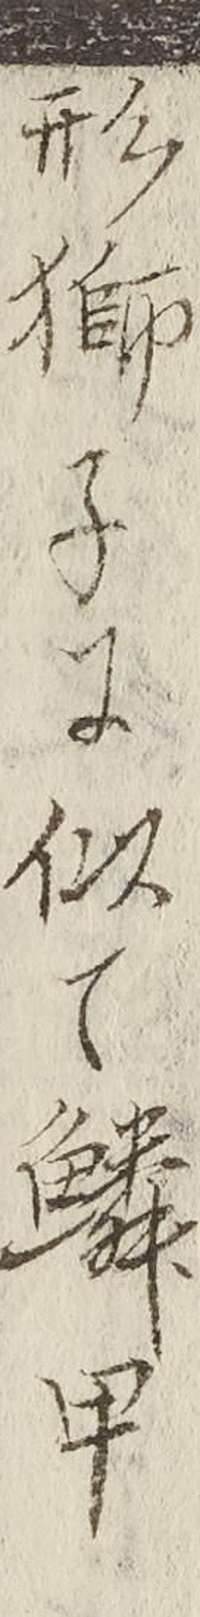形獅子に似て鱗甲
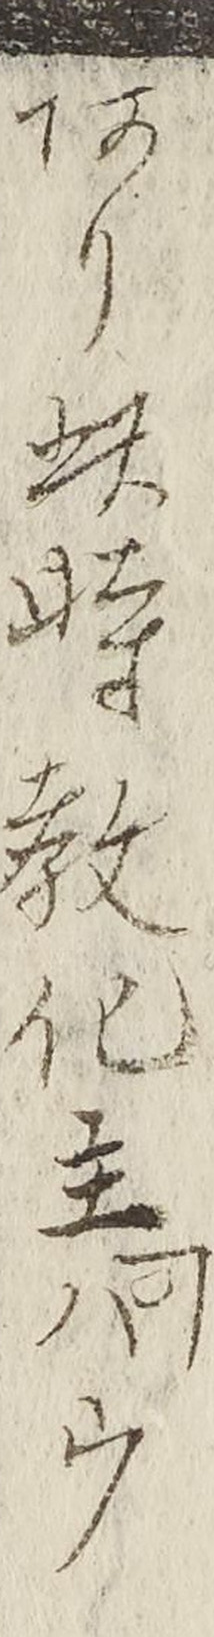あり此時教化主「パウ
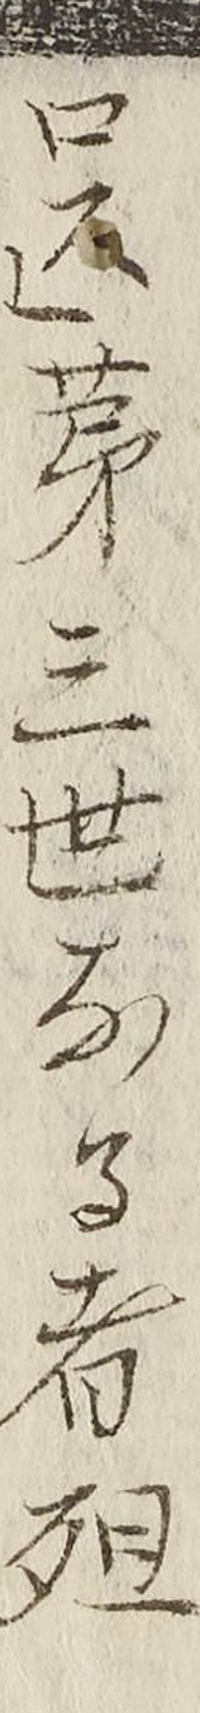ロス」第三世なる者殂
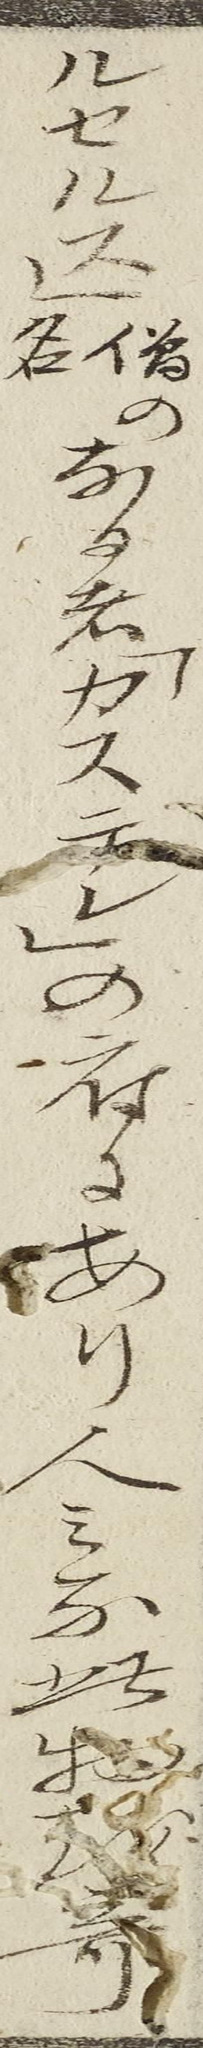ルセルス」僧の名なる者「カステレ」の府にあり人ミな此物を奇
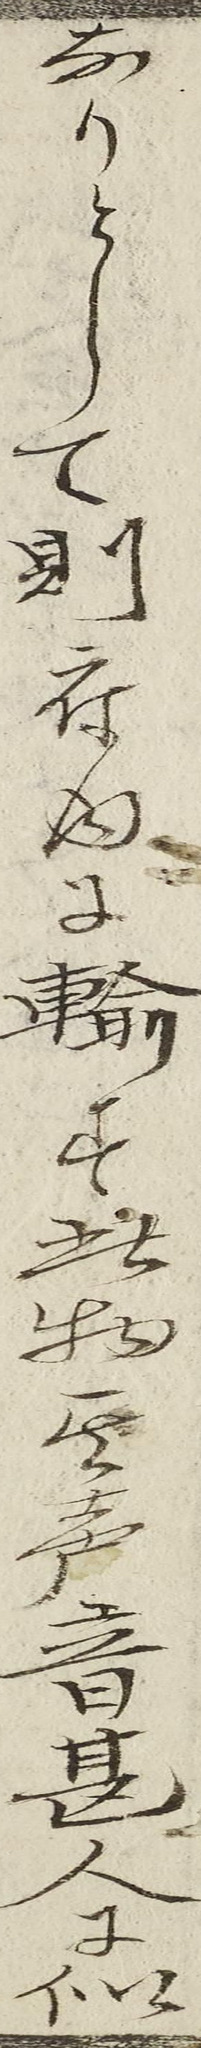なりとして則府内に輸す此物其声音甚人に似
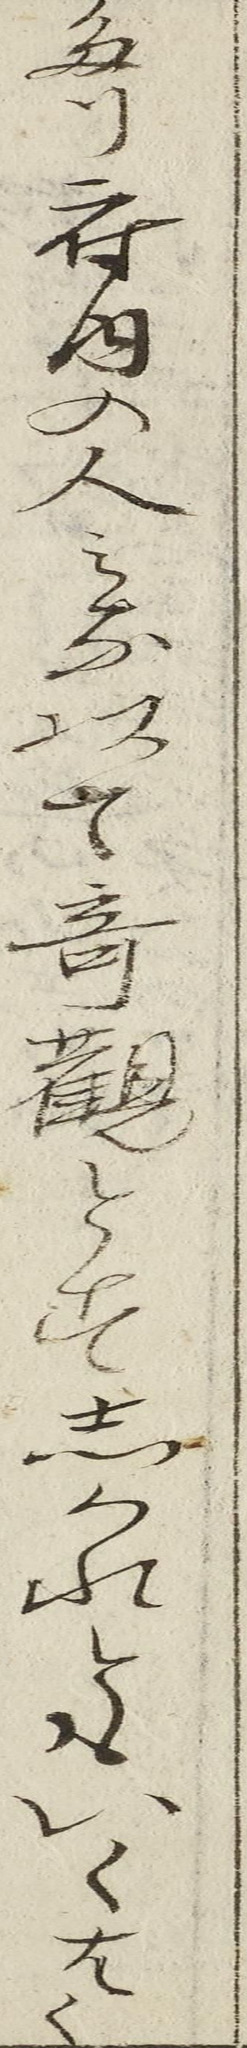たり府内の人ミな以て奇観とすしかれともいくはく
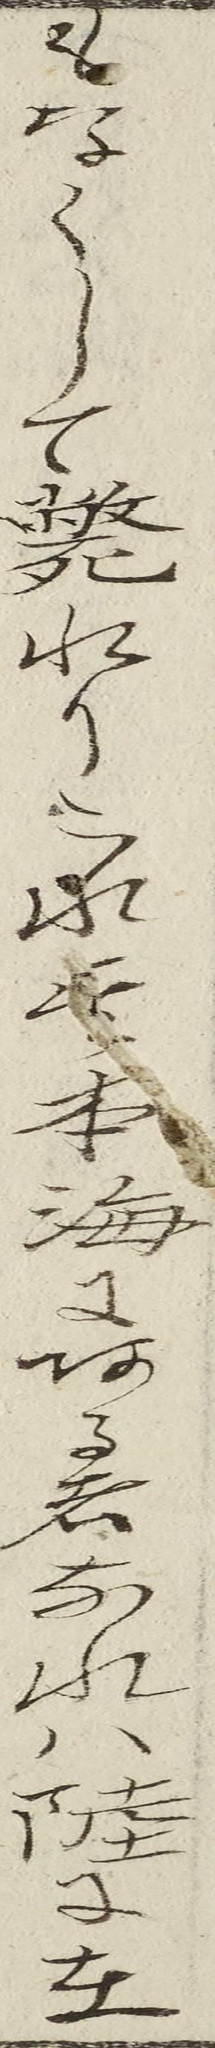もなくして斃れりこれ其本海にある者なれハ陸に在
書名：西洋雜記　乾
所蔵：東京大学地震研究所図書室 Earthquake Research Institute Library, The University of Tokyo, JAPAN
